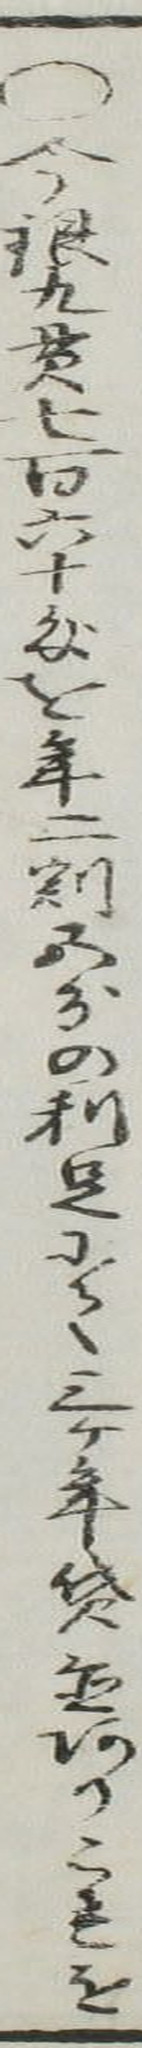○今銀九貫七百六十匁を年二割五分の利足にて三ヶ年貸置ありこれを
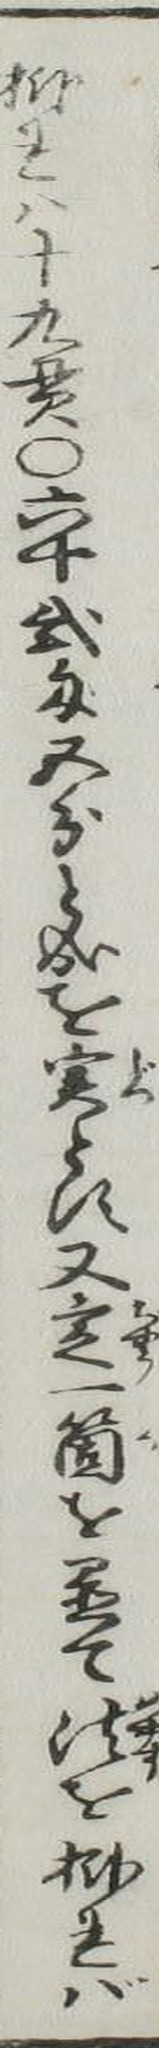掛れは八十九貫〇六十弐匁五分と成を実とす又定一箇を置て法を掛れば
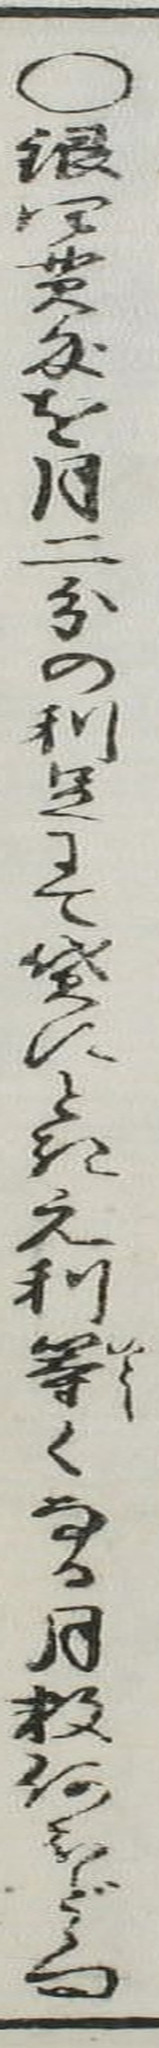○銀四貫匁を月二分の利足にて貸すとき元利等くなる月数何ほどゝ問
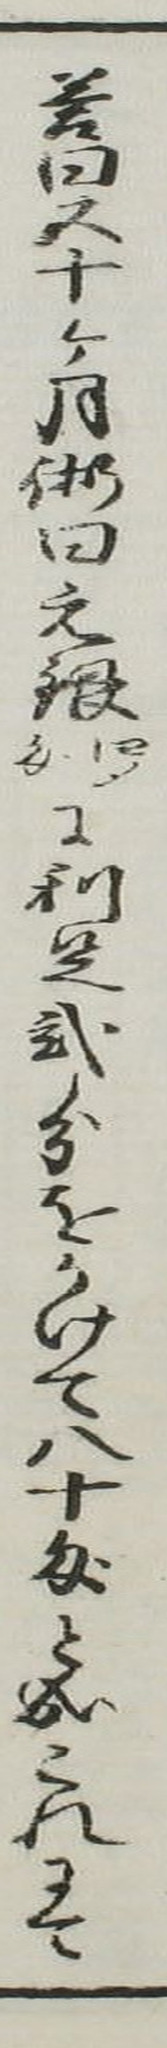答曰五十ヶ月術曰元銀四貫匁に利足弐分をかけて八十匁と成これにて
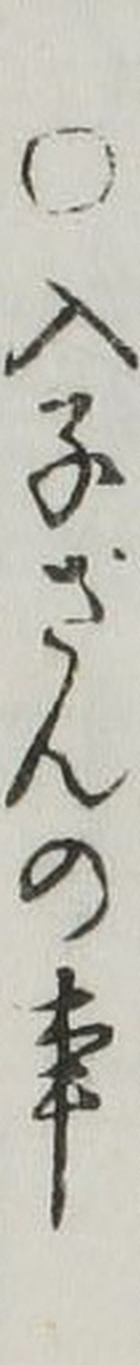○入子ざんの事
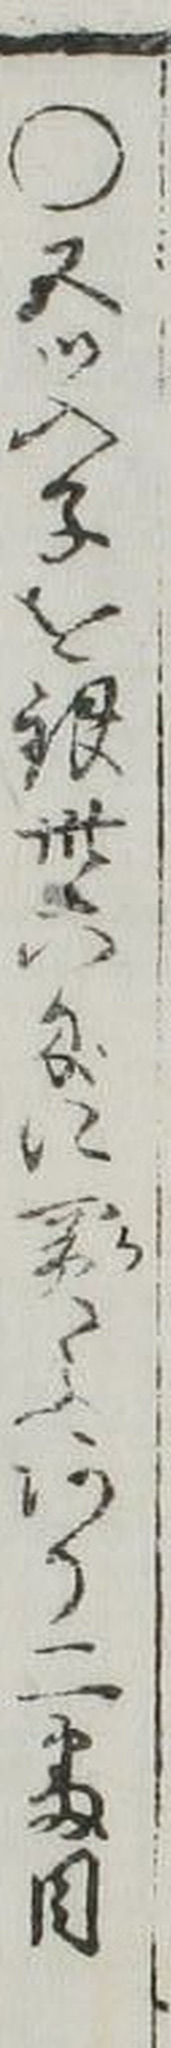○五ツ入子を銀卅六匁に買ふあり二番目
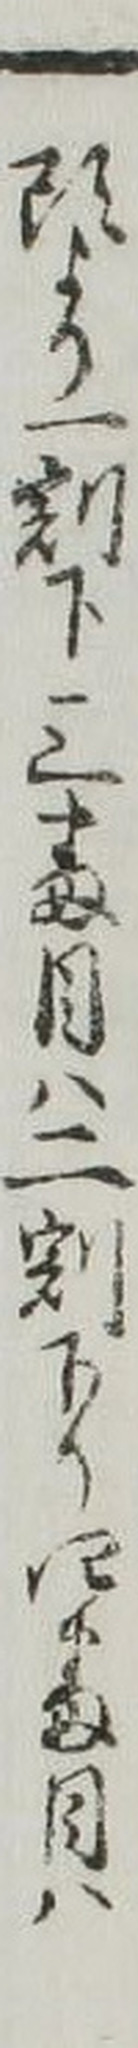頭より一割下三番目は二割下り四番目は
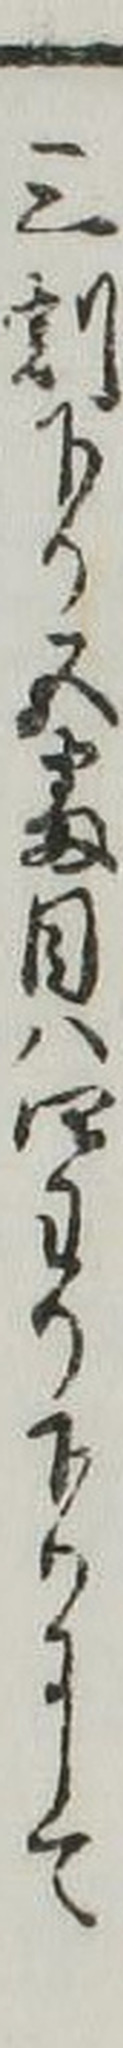三割下り五番目は四わり下りにして
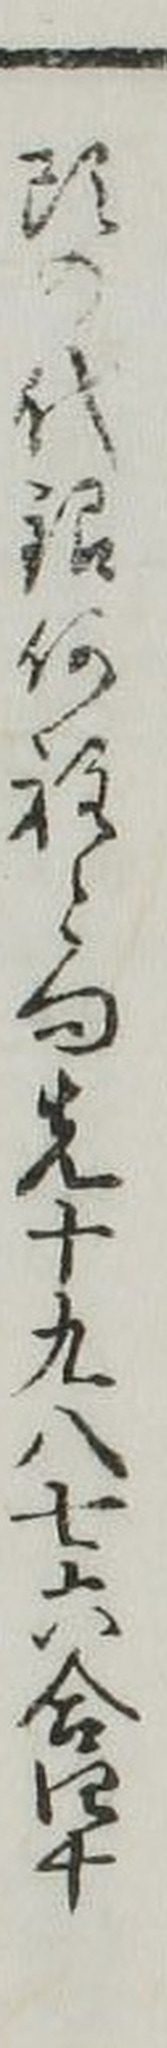頭の代銀何程と問先十九八七六合四十
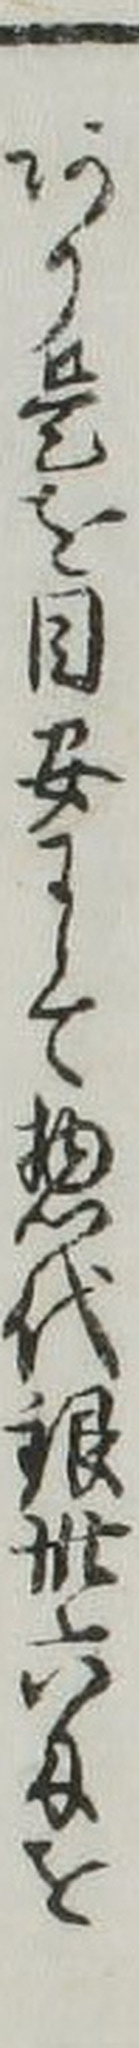あり是を目安にして惣代銀卅六匁を
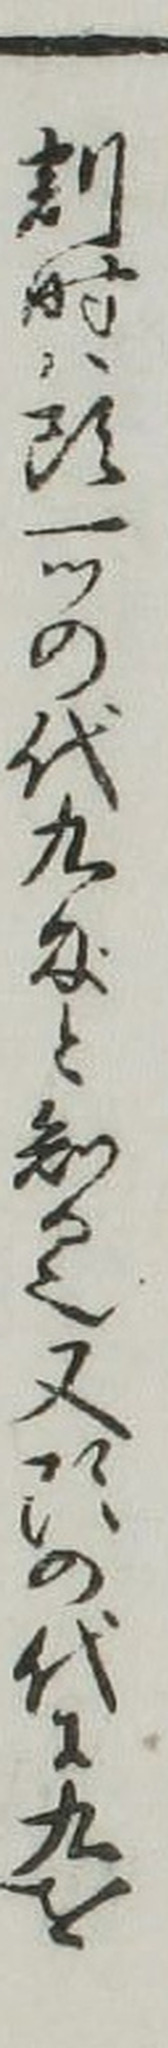割時は頭一ツの代九匁と知る也頭の代に九を
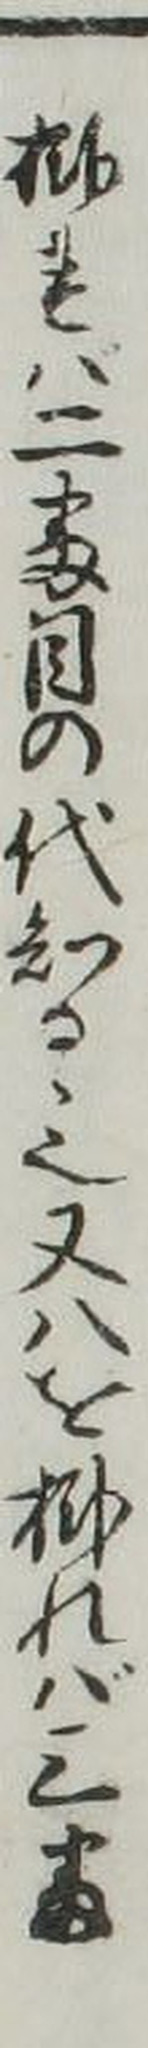掛れば二番目の代知るゝ也又八を掛れば三番
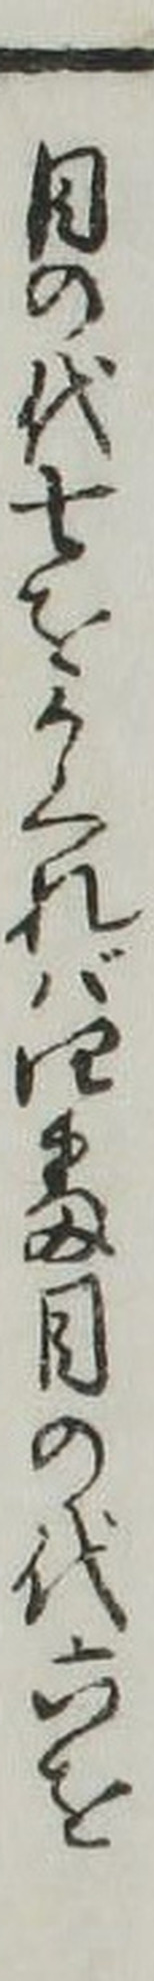目の代七をかくれば四番目の代六を
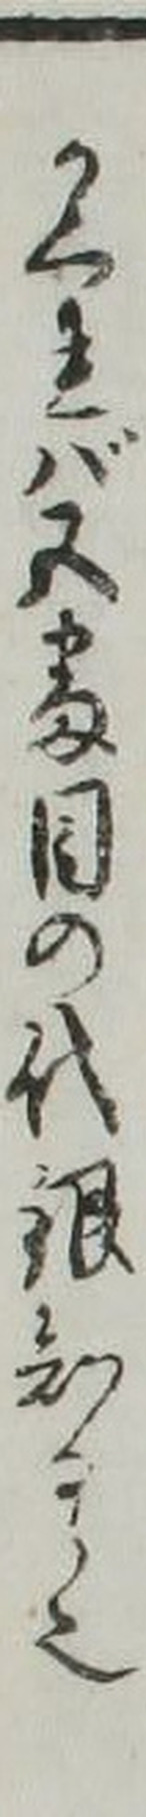かくれば五番目の代銀知るゝ也

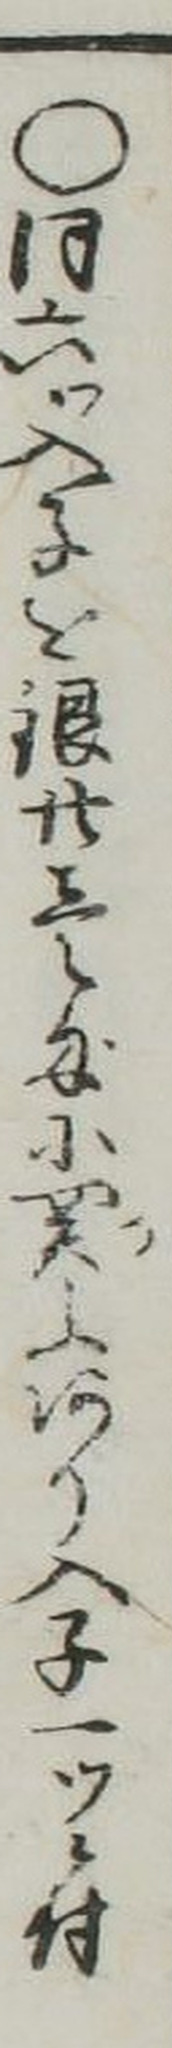○同六ツ入子を銀廿壱匁に買ふあり入子一ツに付
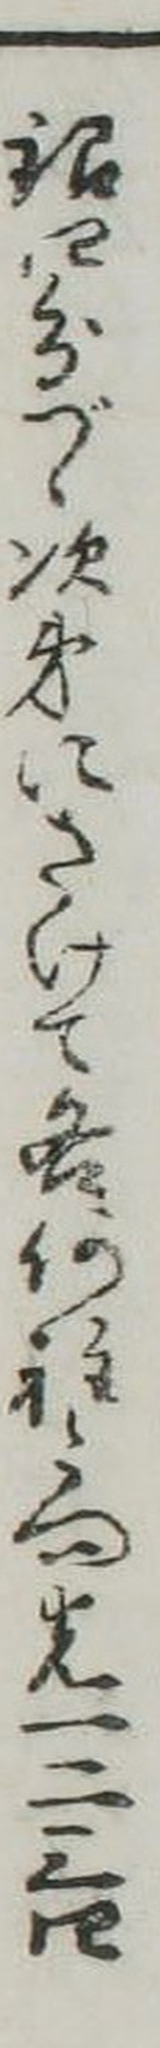銀四分づゝ次第にさけて各何程と問先一二三四
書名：宝玉塵劫記
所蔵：東京学芸大学教育コンテンツアーカイブ
